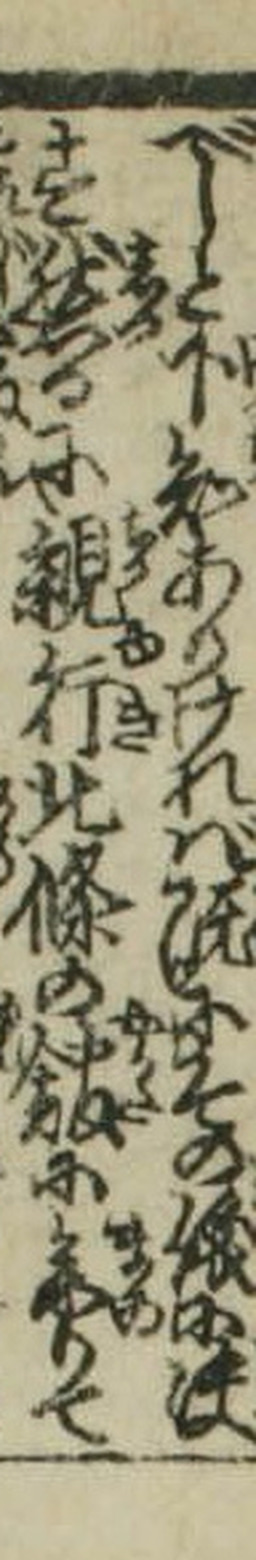す然るに親行北条の館に参りて
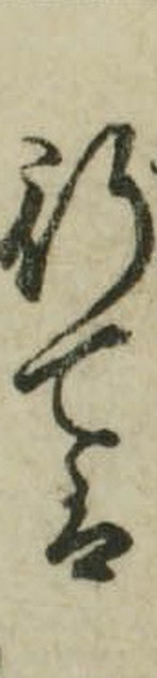行ては
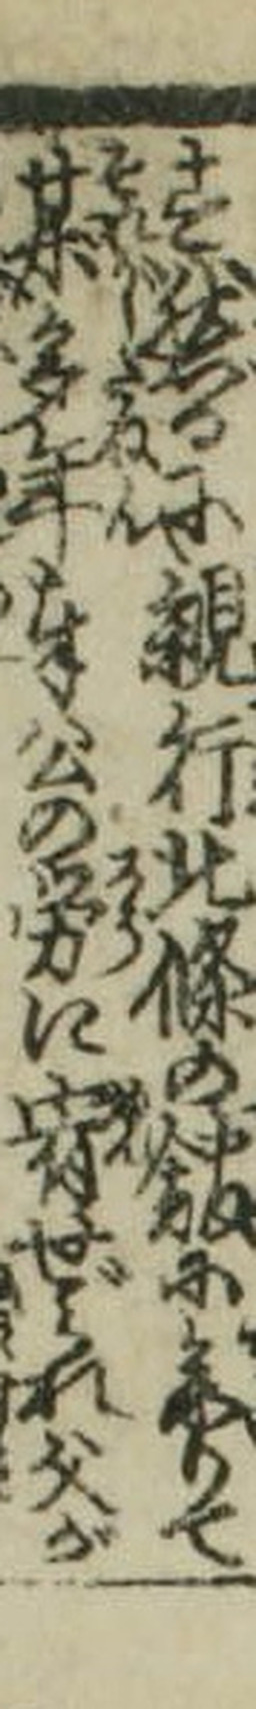某多年奉公の労に宥ぜられ父が
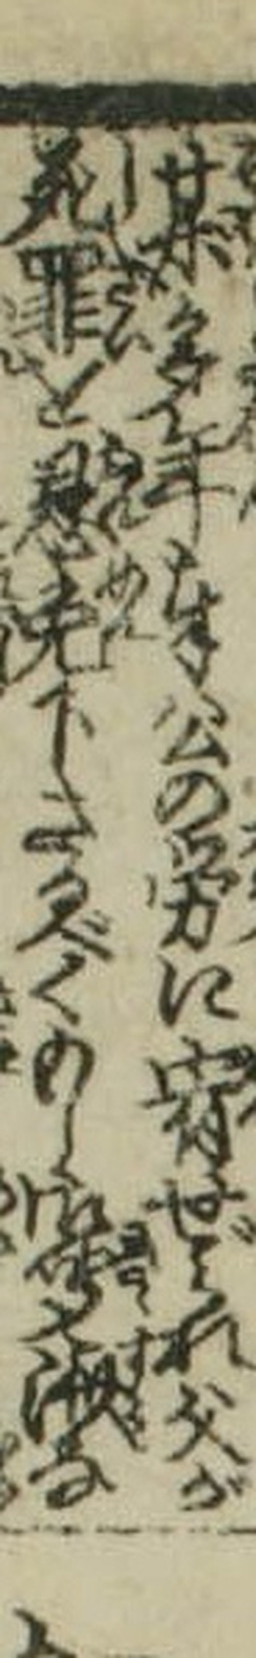死罪を恩免下さるべくもし御聞済な
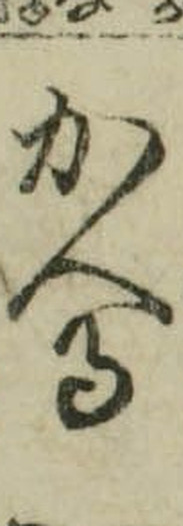かへる
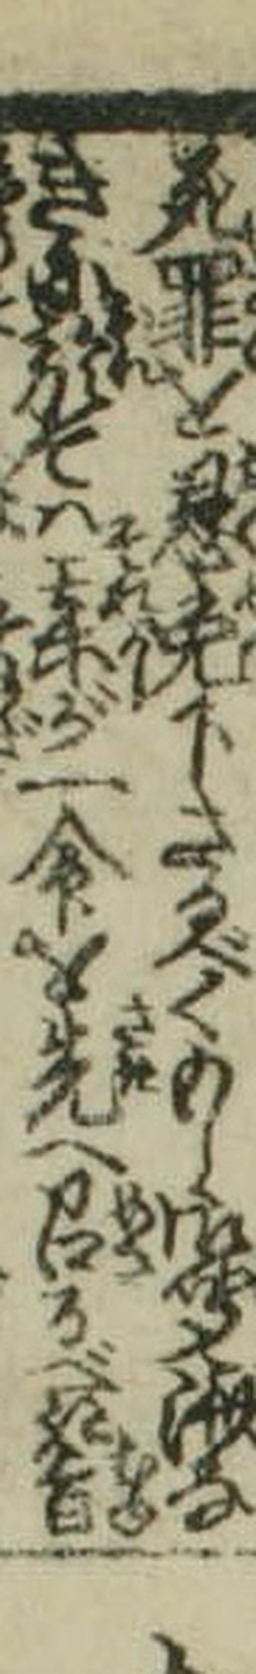きに於ては某が一命を先へ召るべき旨
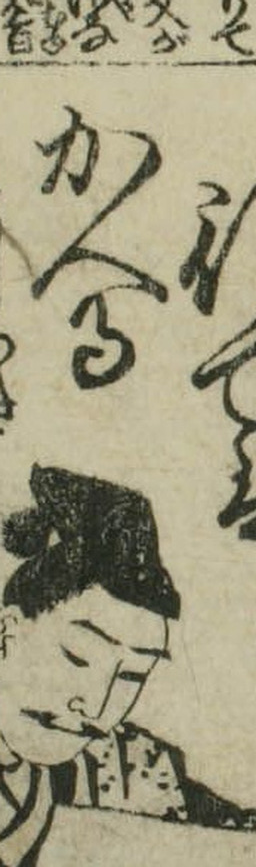かへる
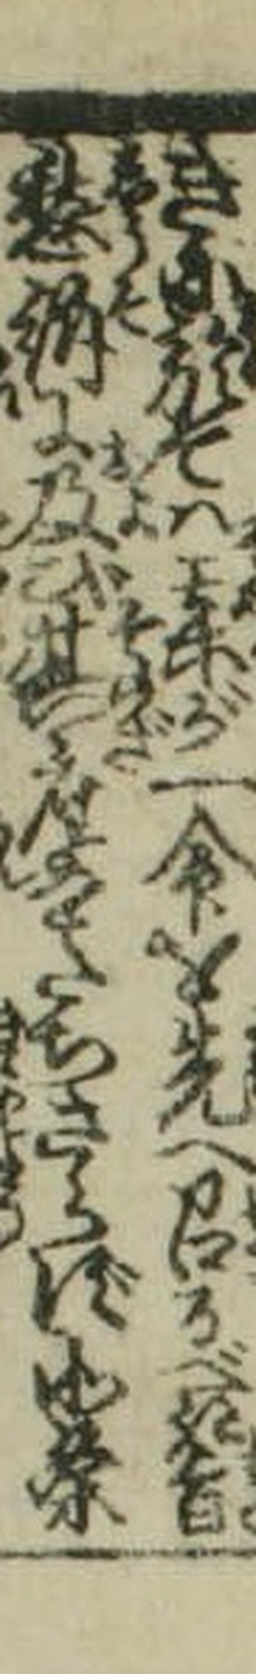愁訴に及び其座たちさらず北条
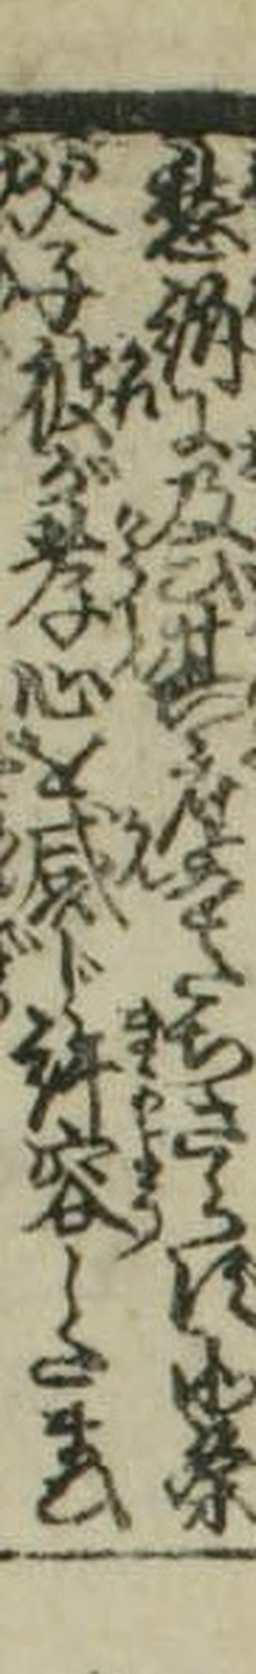父子彼が孝心を感じ許容したまひ
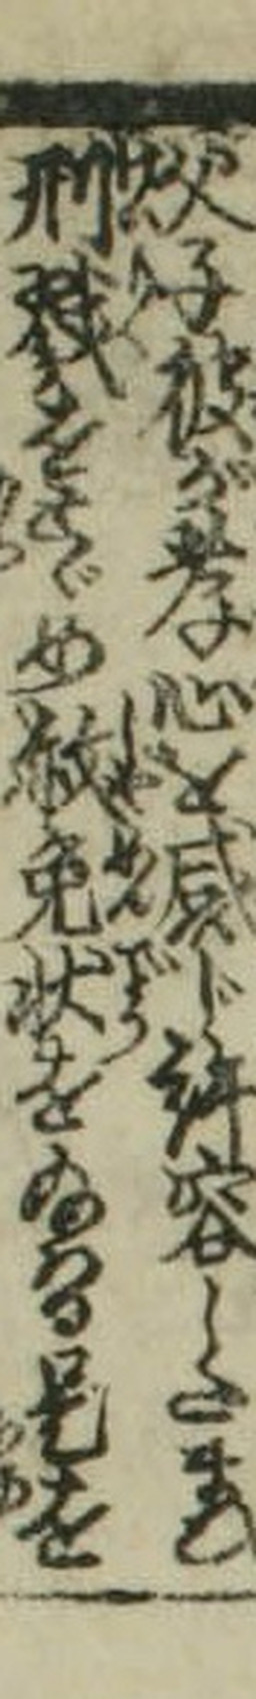刑戮をとゞめ赦免状を給はる是を
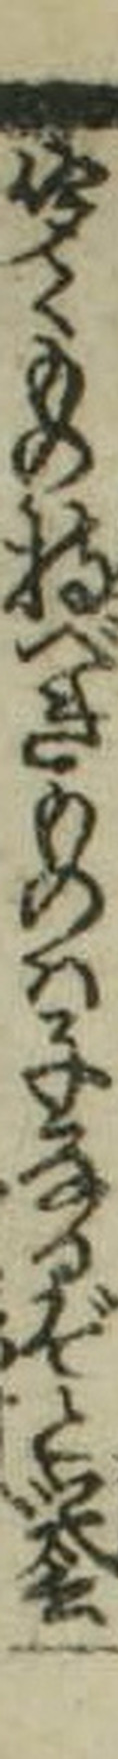聞くもの持べきものは子なるぞと誉
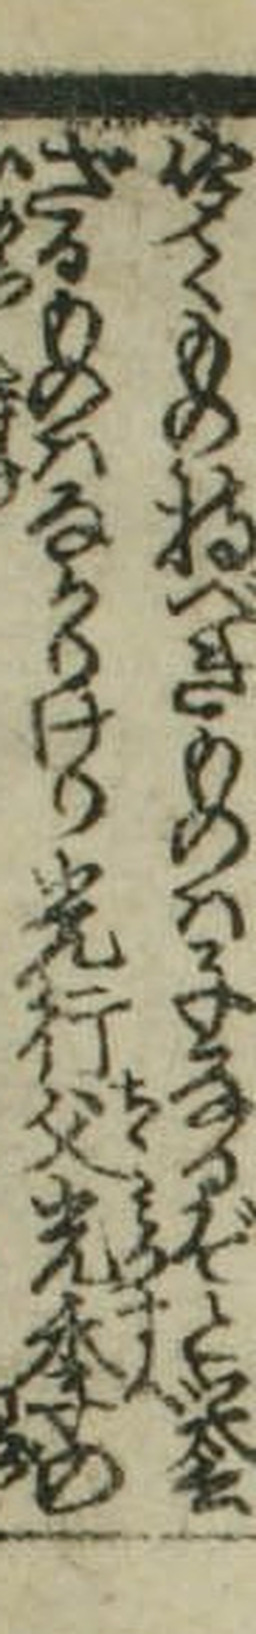ざるものはなかりけり光行父光季の
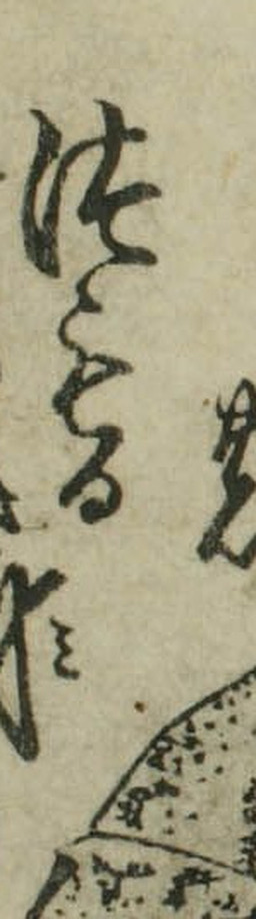つもる
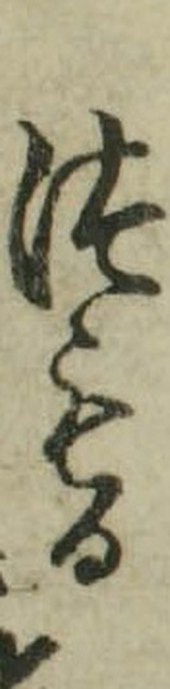つもる
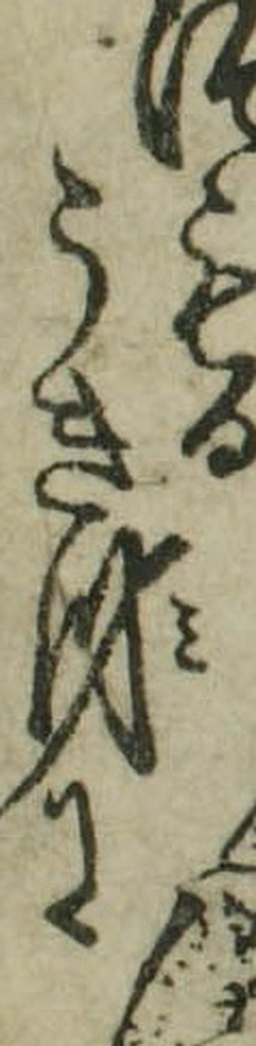うき身に
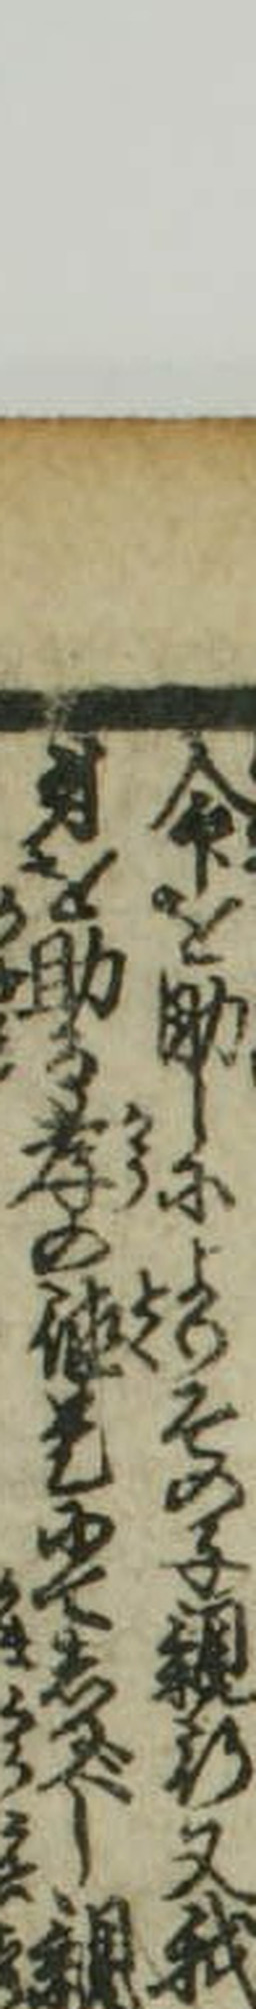命を助る孝の徳是にてしるべし親
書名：續英雄百人一首
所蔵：東京学芸大学附属図書館
